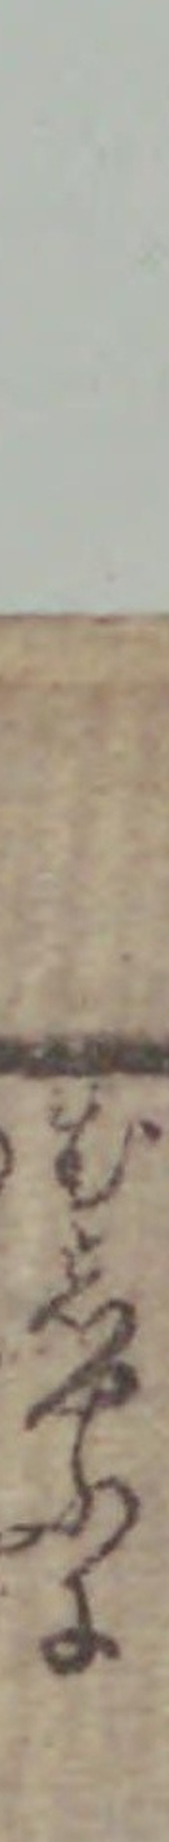むしやふに
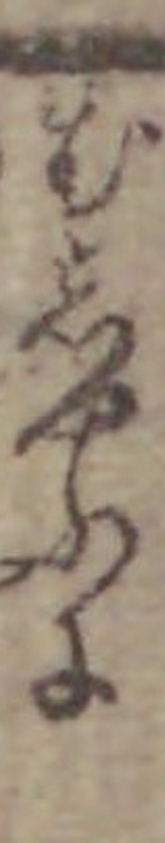むしやふに
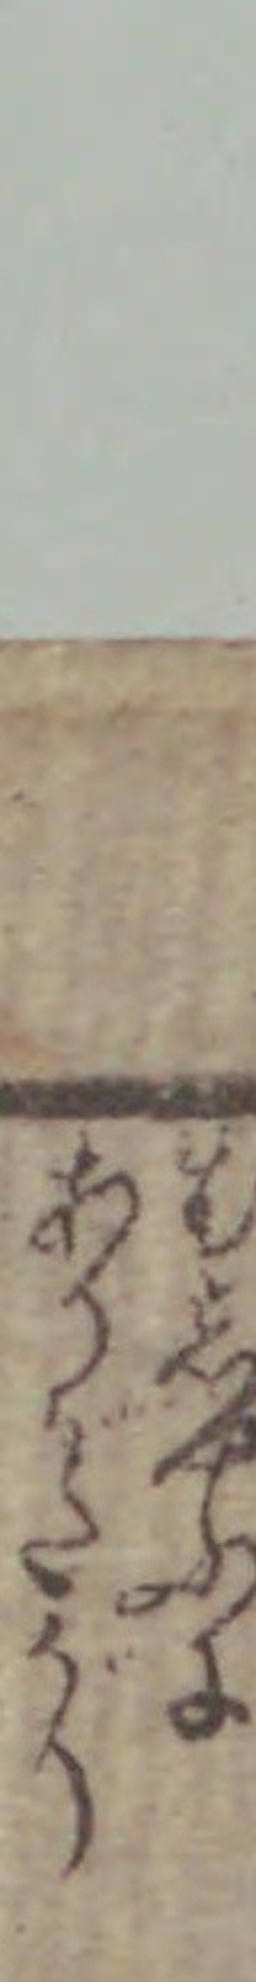ありがたがり
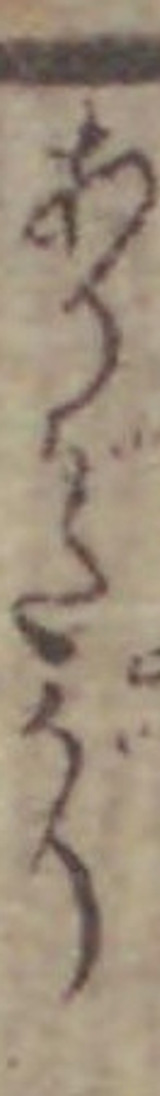ありがたがり
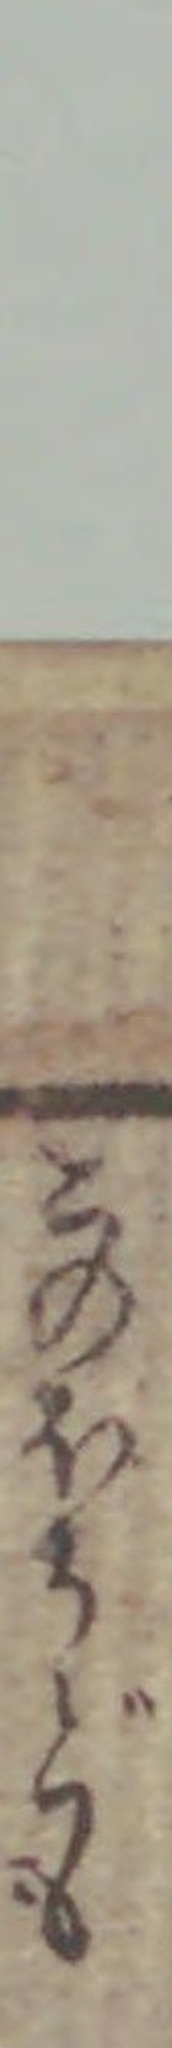このほうども
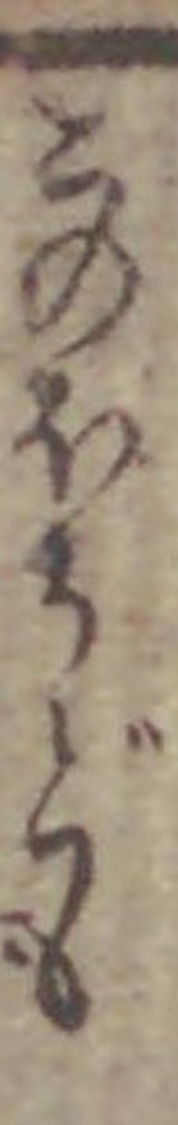このほうども
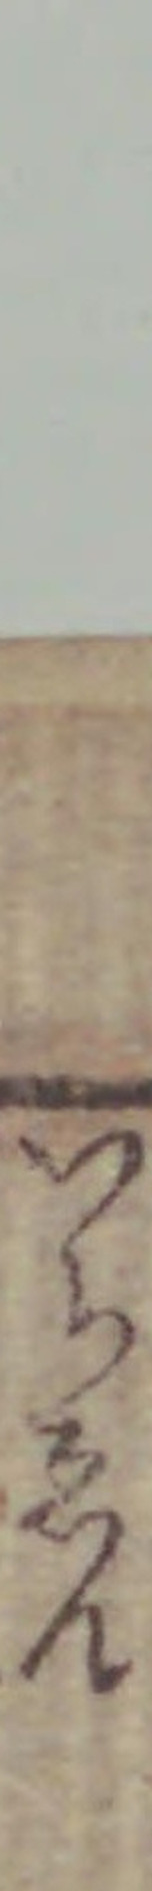いちゑん
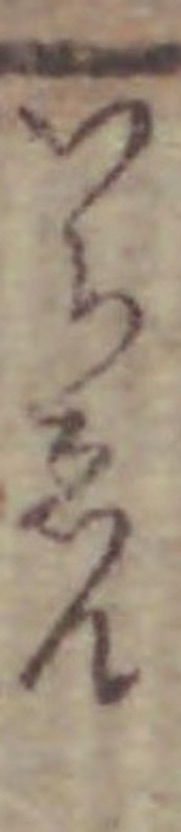いちゑん
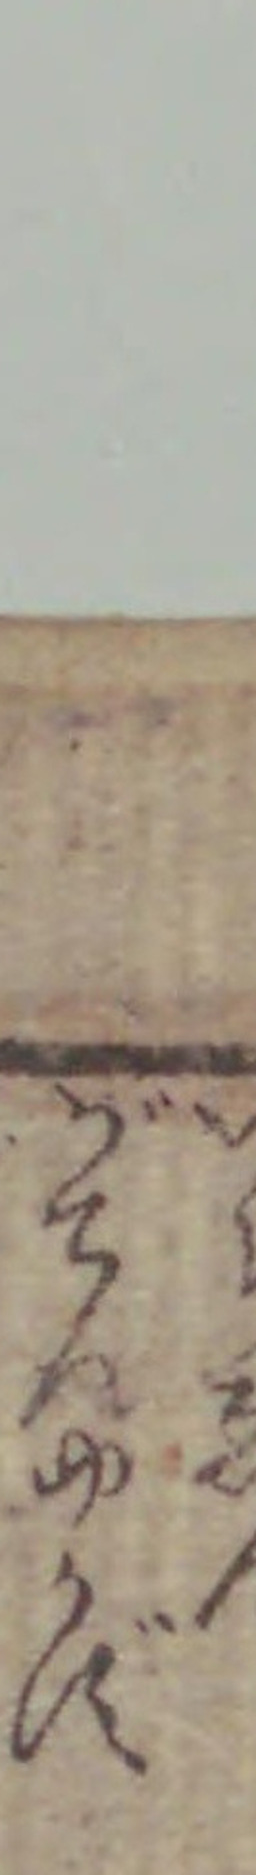がてんゆかず
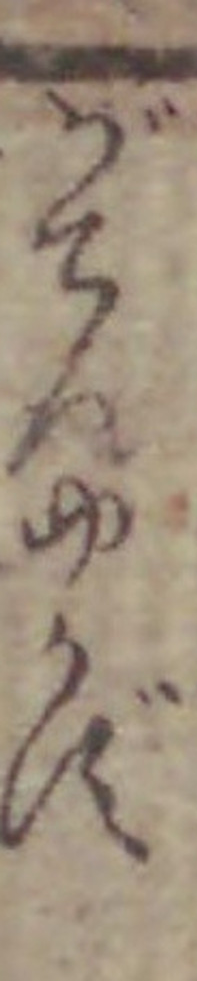がてんゆかず
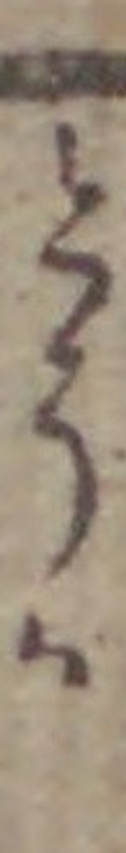どうか
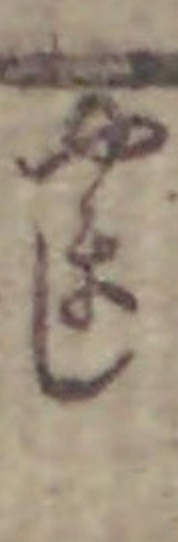やまし
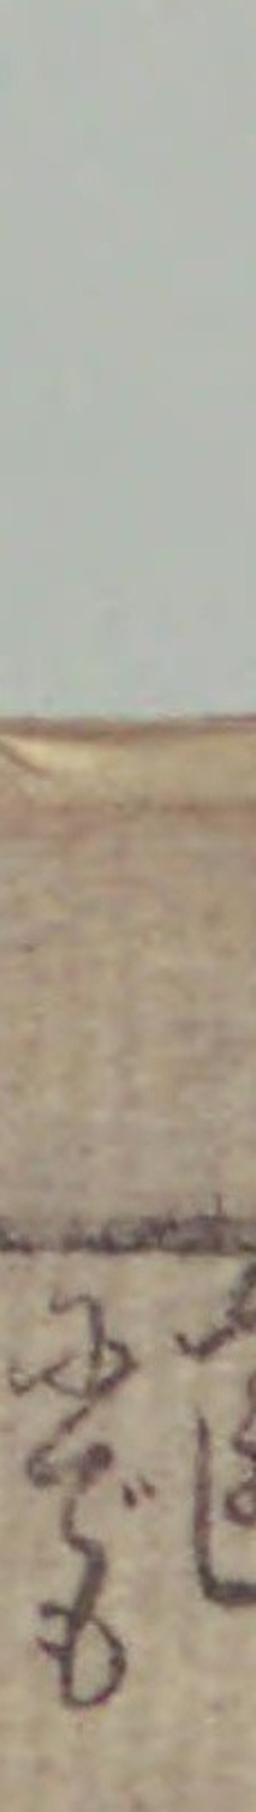にでも
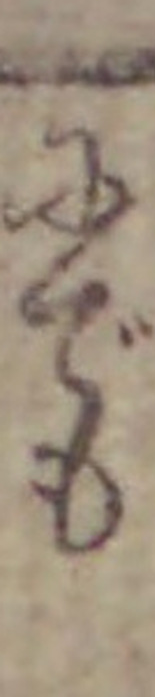にでも
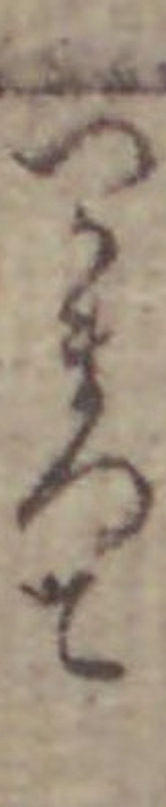つかまつて
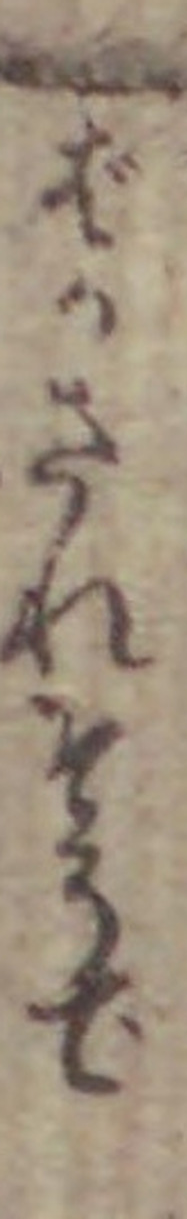ばかされそうで
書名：化物鼻がひしげ 2巻
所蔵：国立国会図書館 National Diet Library, JAPAN
